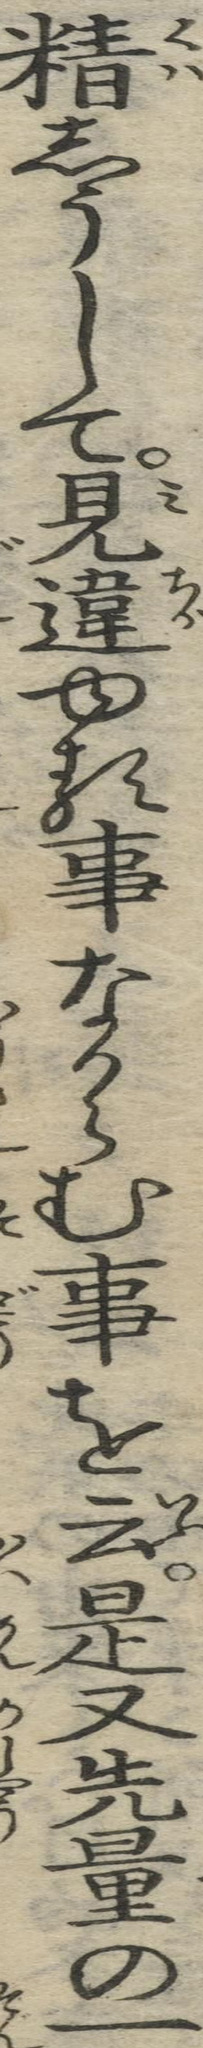精しうして。見違ゆる事なからむ事を云。是又先量の一
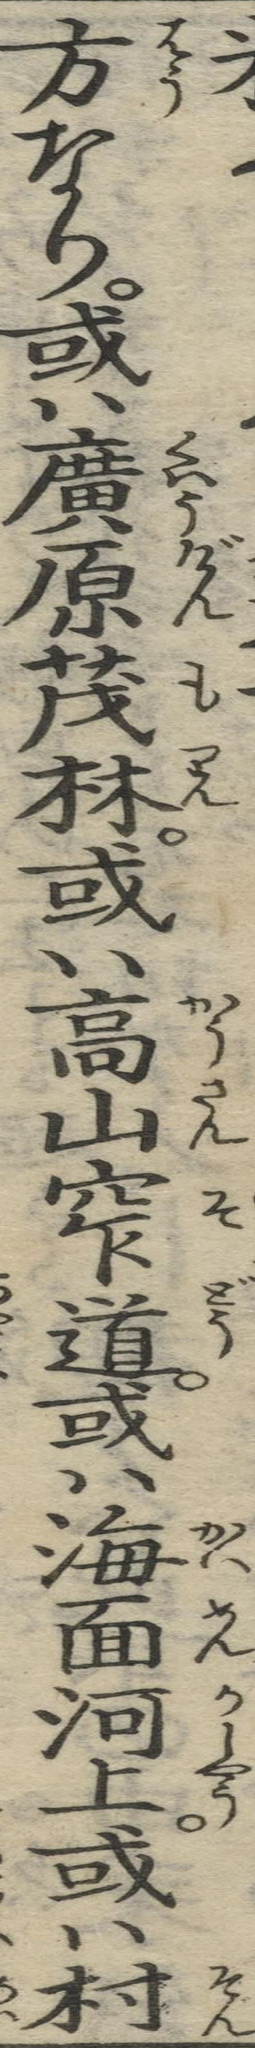方なり。或は広原茂林。或は高山窄道。或は海面河上。或は村
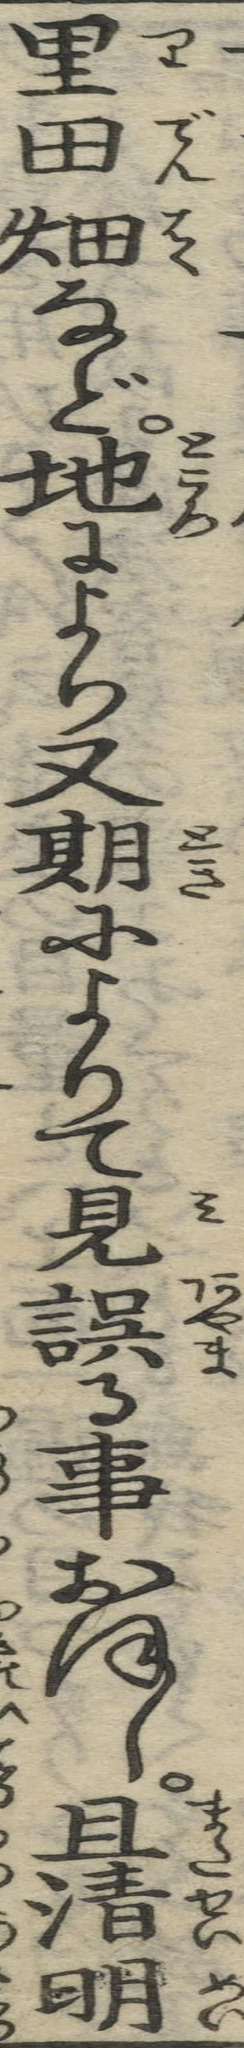里田畑など。地により又期によりて見誤る事おほし。且清明
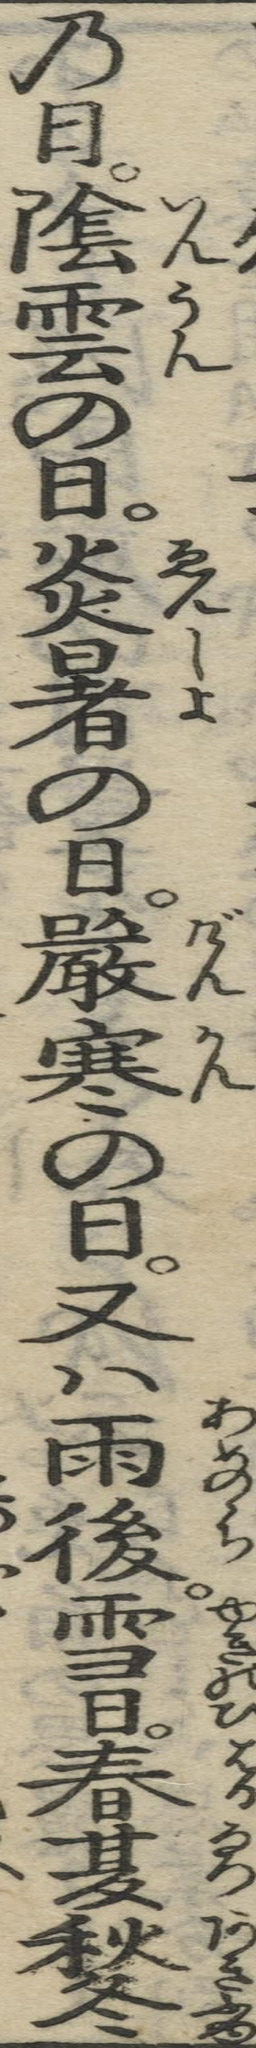乃日。陰雲の日。炎暑の日。厳寒の日。又は雨後。雪日。春夏秋冬
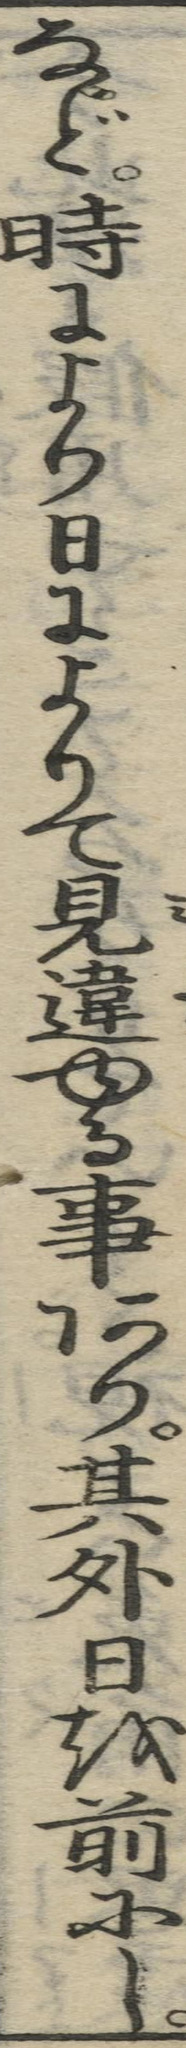など。時により日によりて見違ゆる事あり。其外日を前にし。
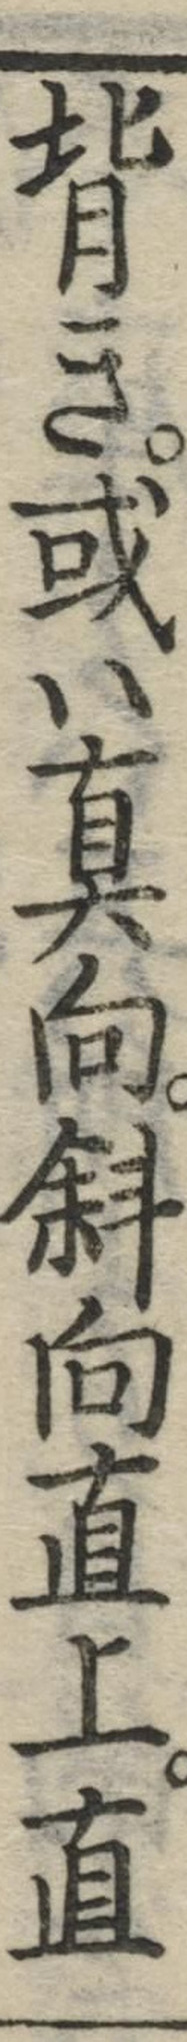背き。或は真向。斜向直見。直
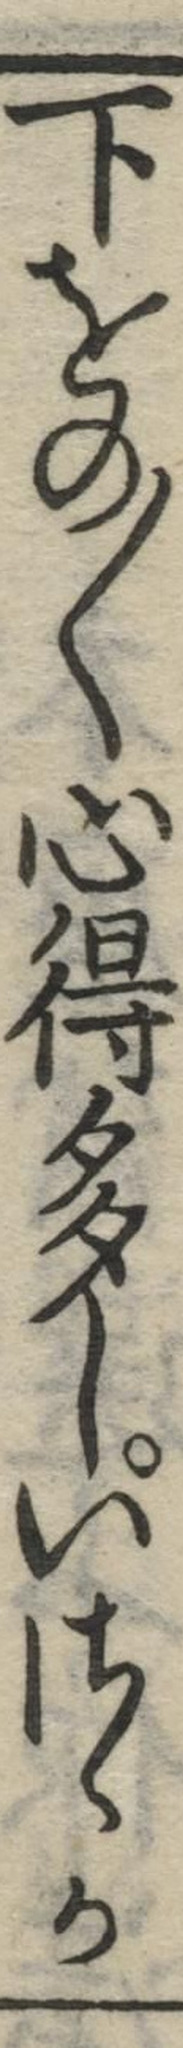下をの〳〵心得多し。いさゝか
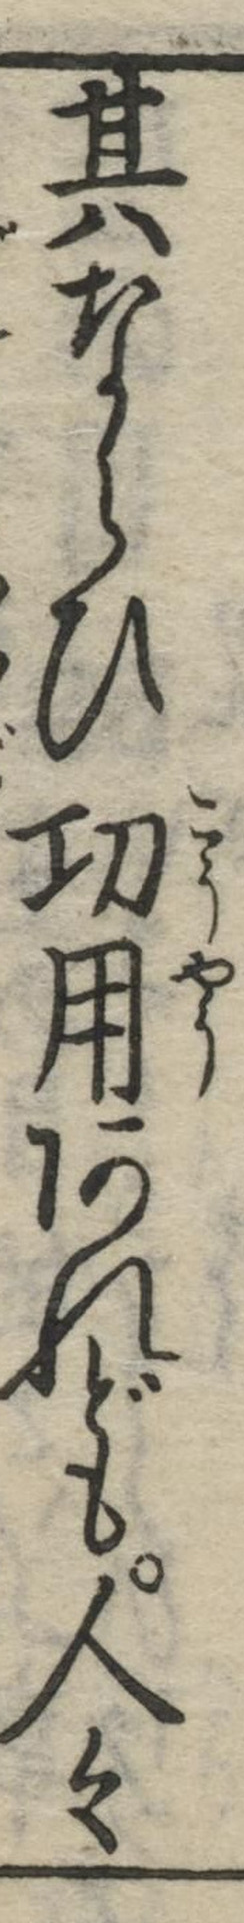其ならひ功用あれども。人々
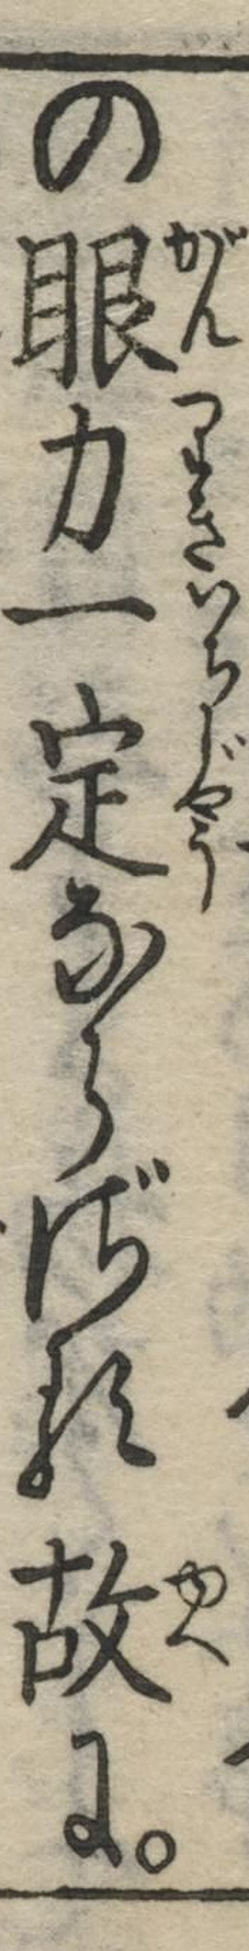の眼力一定ならざる故に。
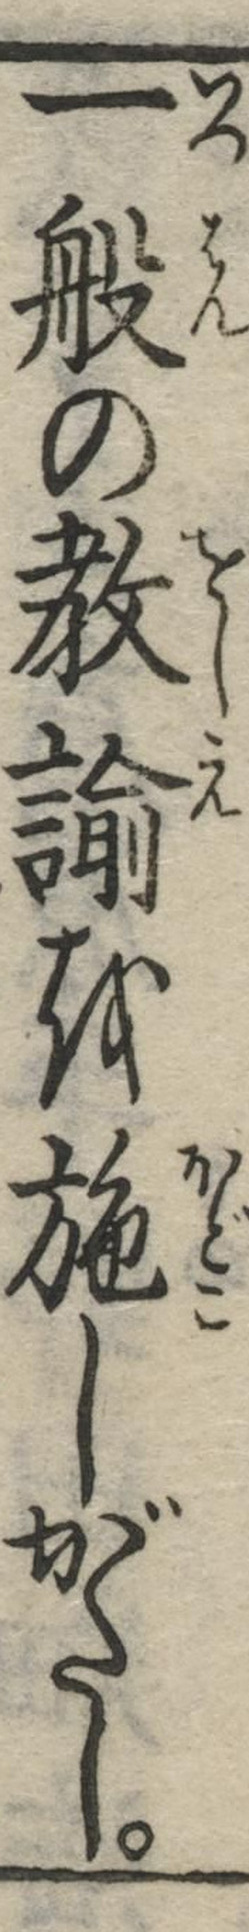一般の教諭を施しがたし。
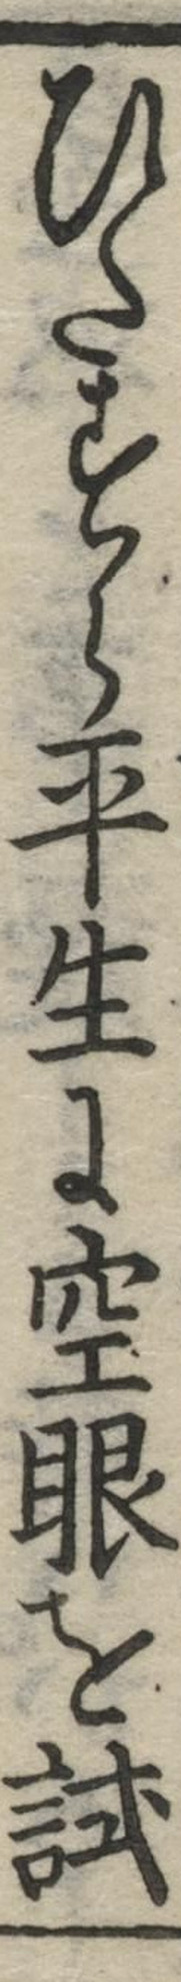ひたすら平生に空眼を試
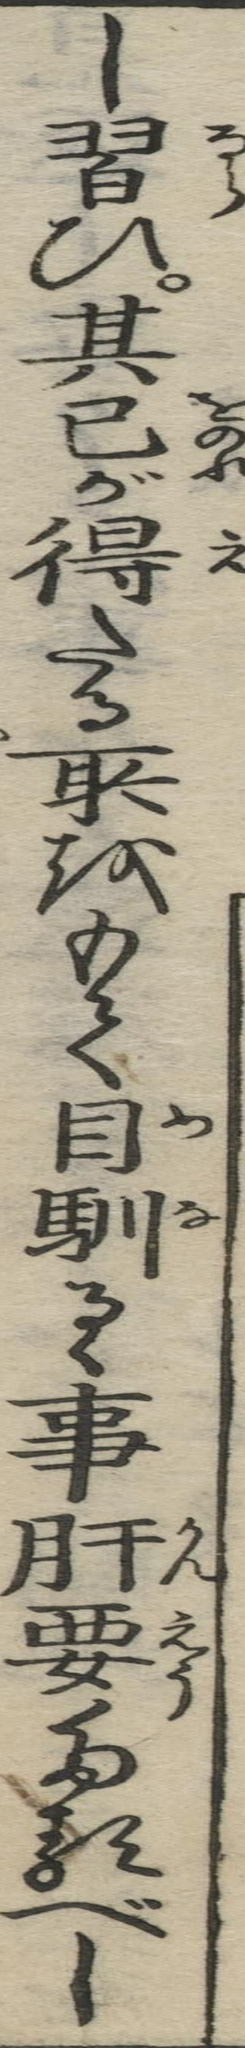し習ひ。其己が得たる所をもて目馴るゝ事肝要たるべし
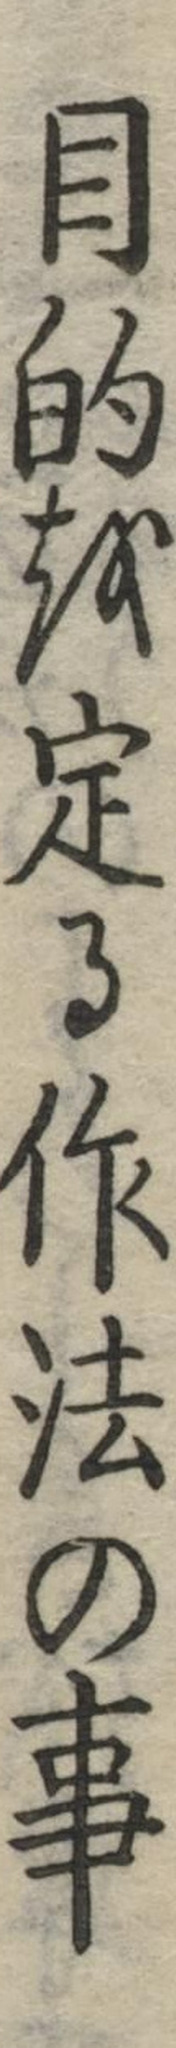目的を定る作法の事
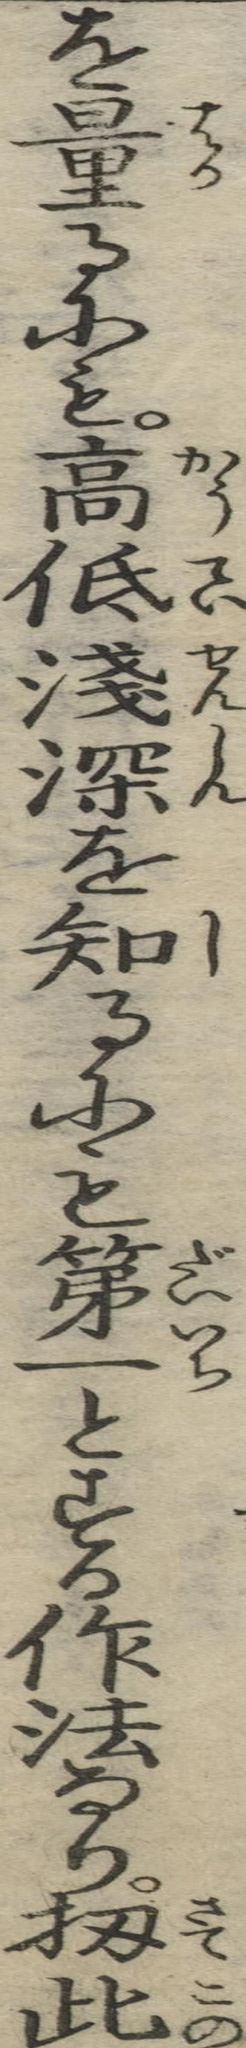を量るにも。高低浅深を知るにも第一とする作法なり。扨此

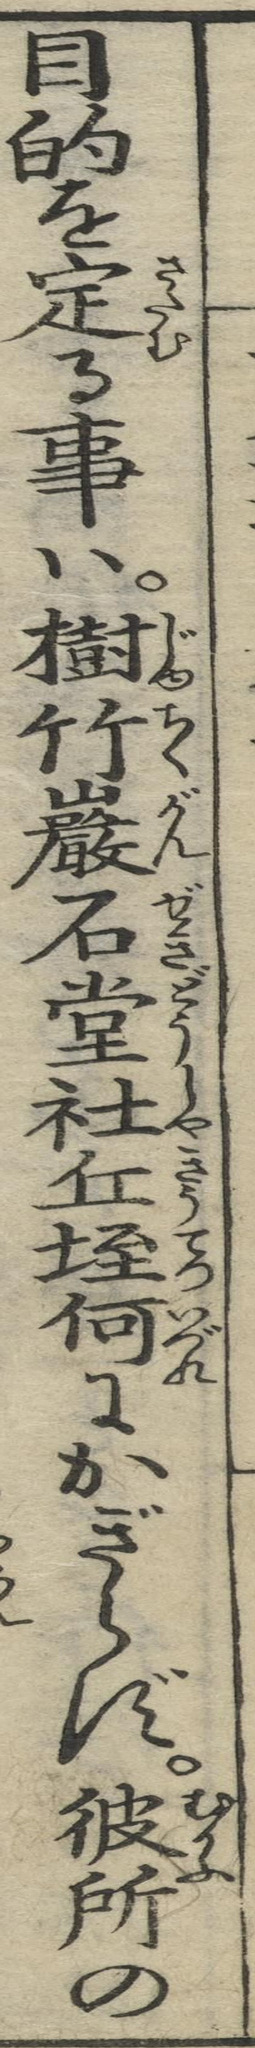目的を定る事は。樹竹岩石堂舎丘垤何にかぎらず。彼所の
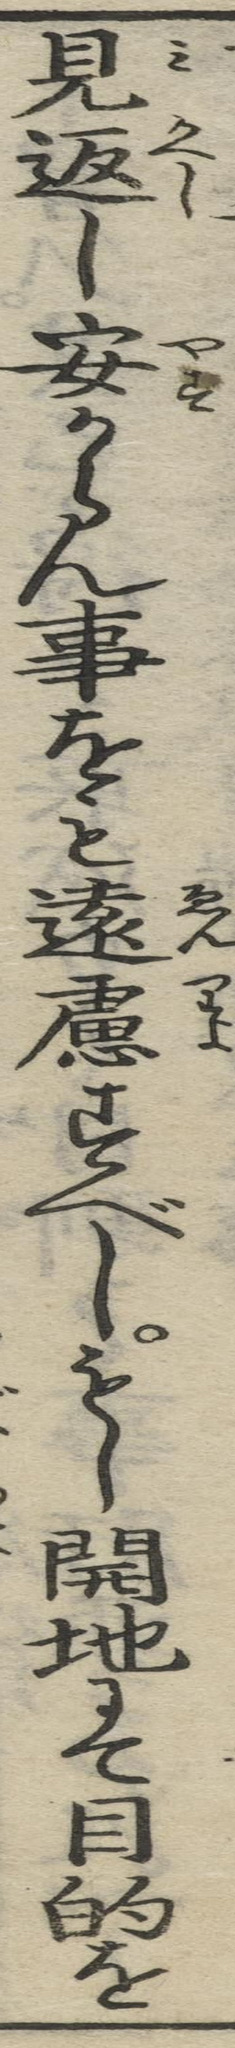見返し安からん事をと遠慮すべし。もし開地にて目的を
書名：量地指南　巻之一（内題）
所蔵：東京大学地震研究所図書室 Earthquake Research Institute Library, The University of Tokyo, JAPAN
